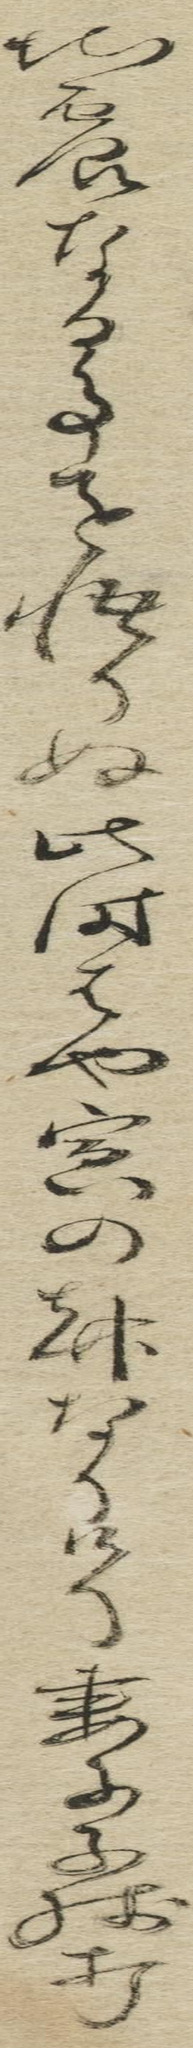地震なる事を悟りぬ此時はや寅の刻なりけり妻子不残打
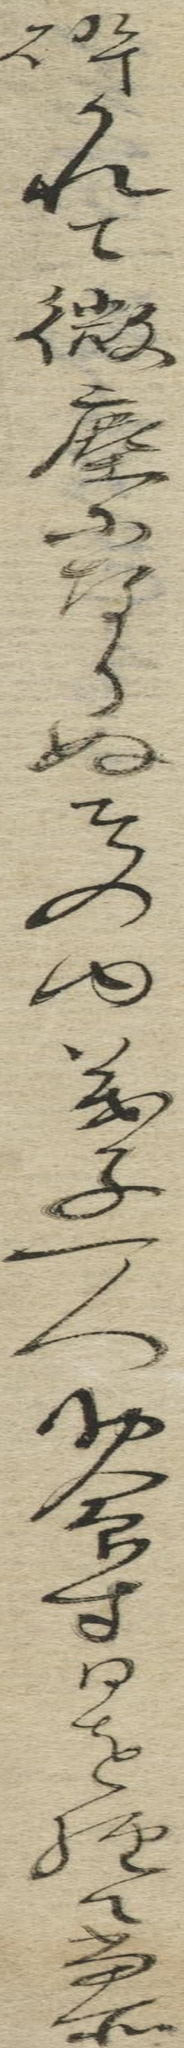砕かれて微塵になりぬその内義子一人助命す日を経て当所

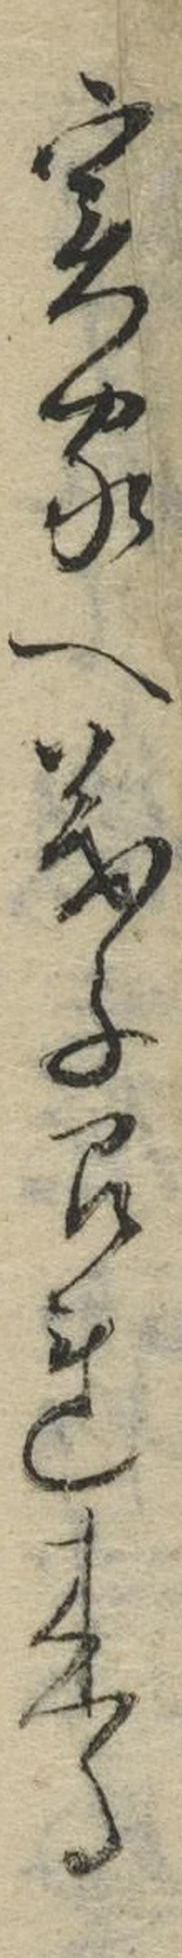実家へ義子召連来る

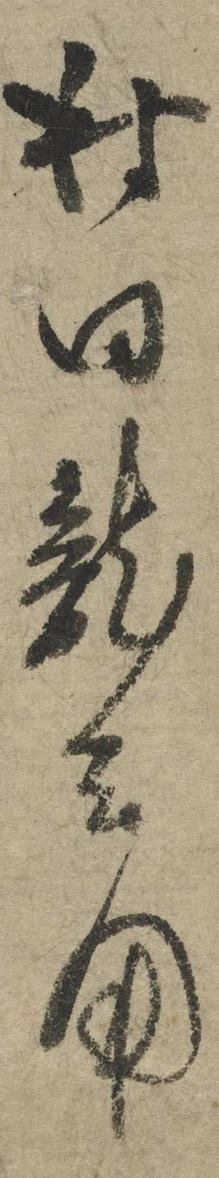村田龍三用
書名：弘化丁未天變日記
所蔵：東京大学地震研究所図書室 Earthquake Research Institute Library, The University of Tokyo, JAPAN
